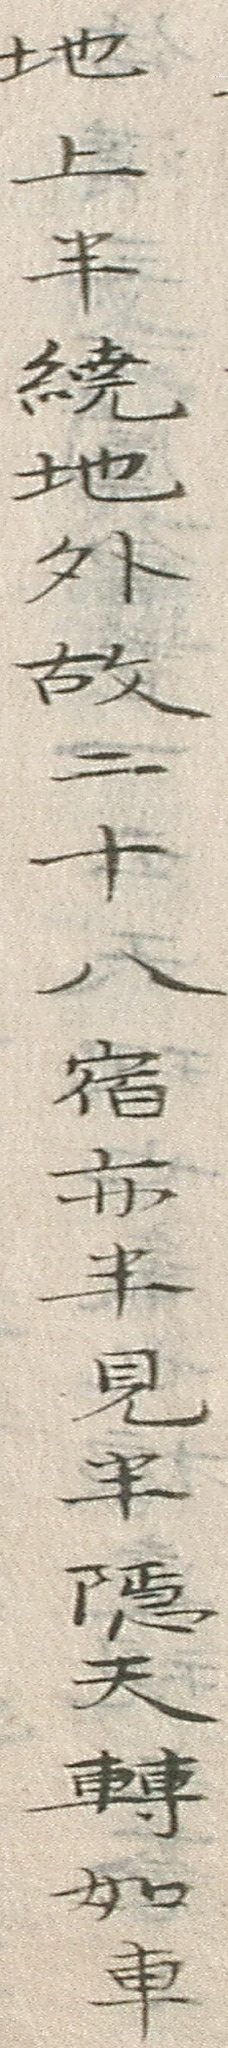地上半繞地外故二十八宿亦半見半𨻳天転如車
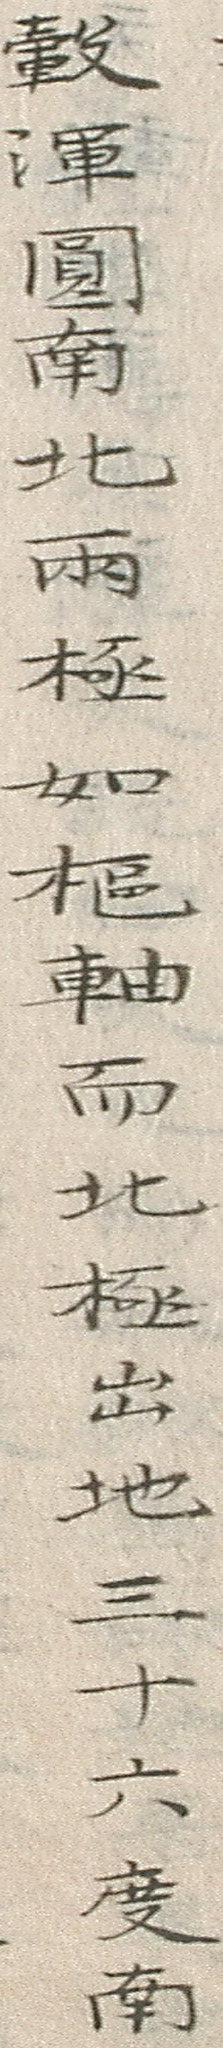轂渾円南北両極如枢軸而北極出地三十六度南
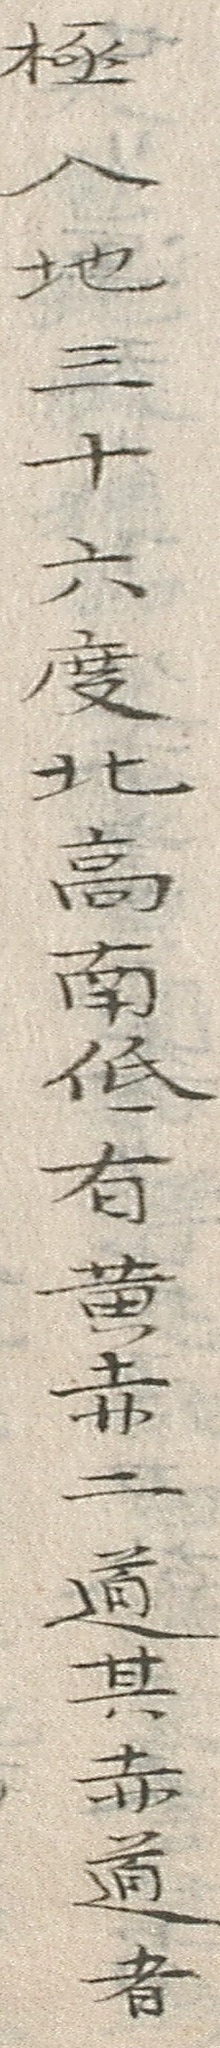極入地三十六度北高南低有黄赤二道其赤道者
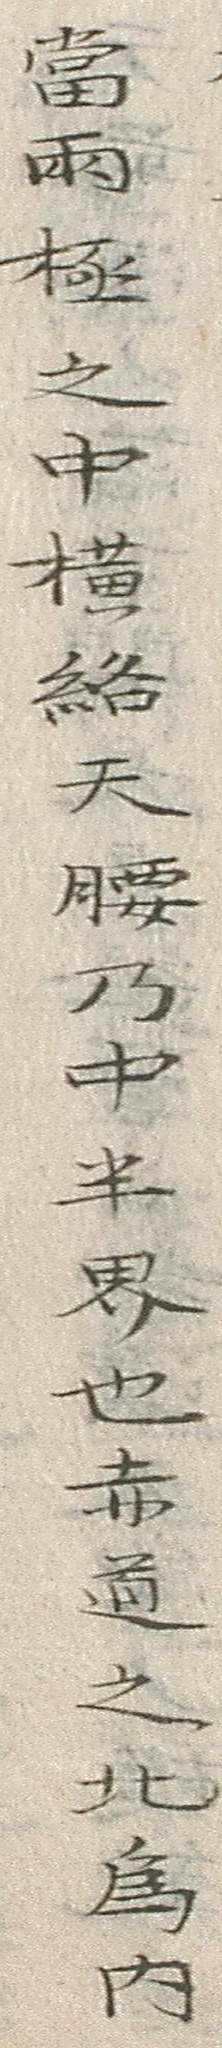当両極之中横絡天腰乃中半界也赤道之北為内
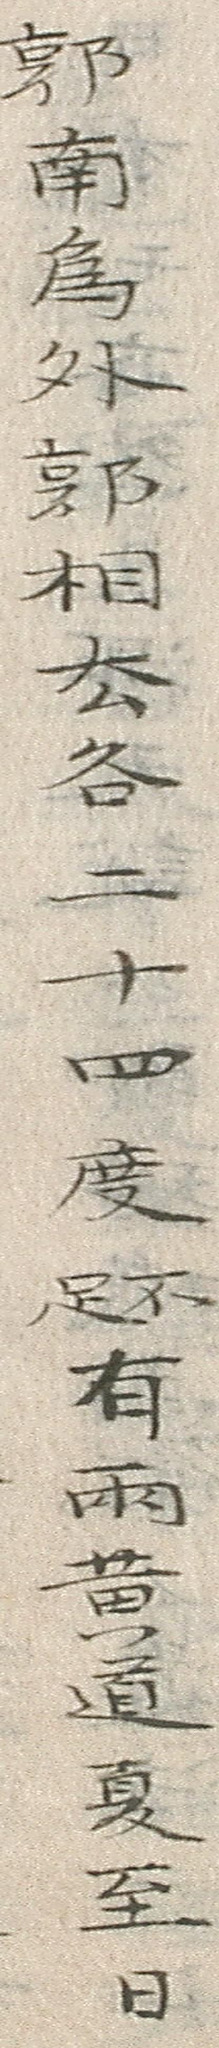郭南為外郭相厺各二十四度不足有両黄道夏至日
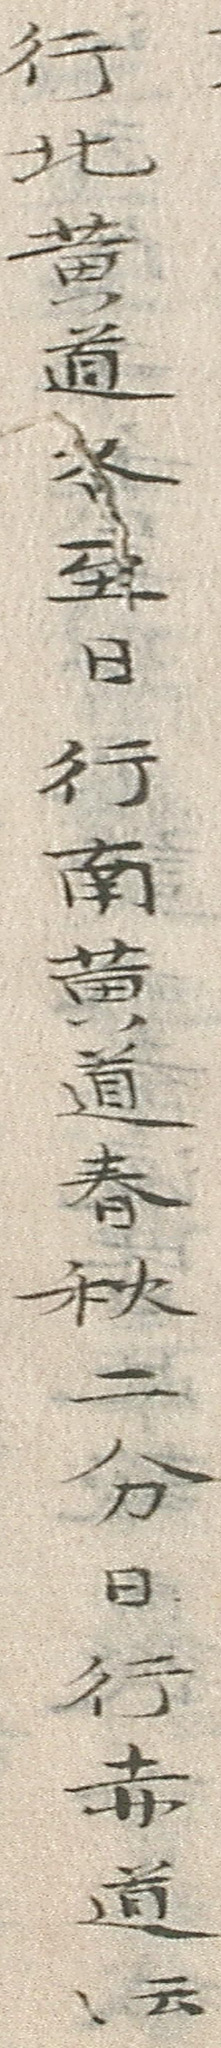行北黄道冬至日行南黄道春秋二分日行赤道云〻
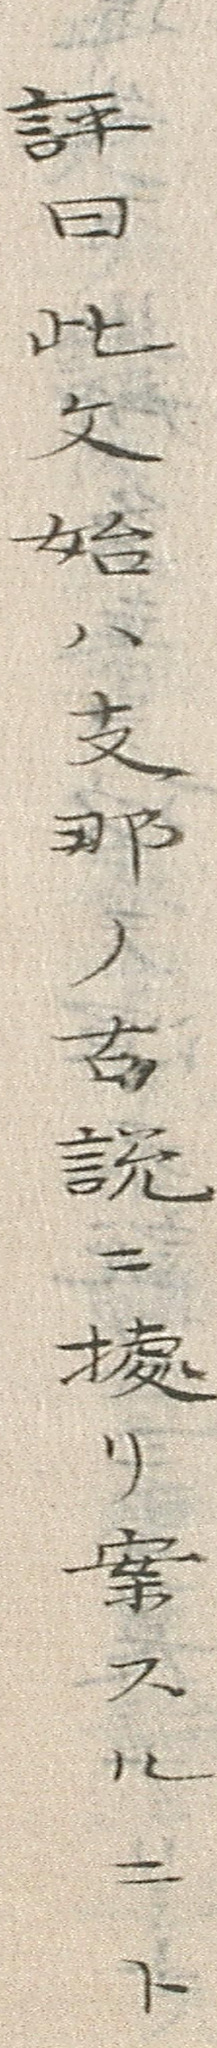評曰此文始ハ支那ノ古説ニ拠リ案スルニト
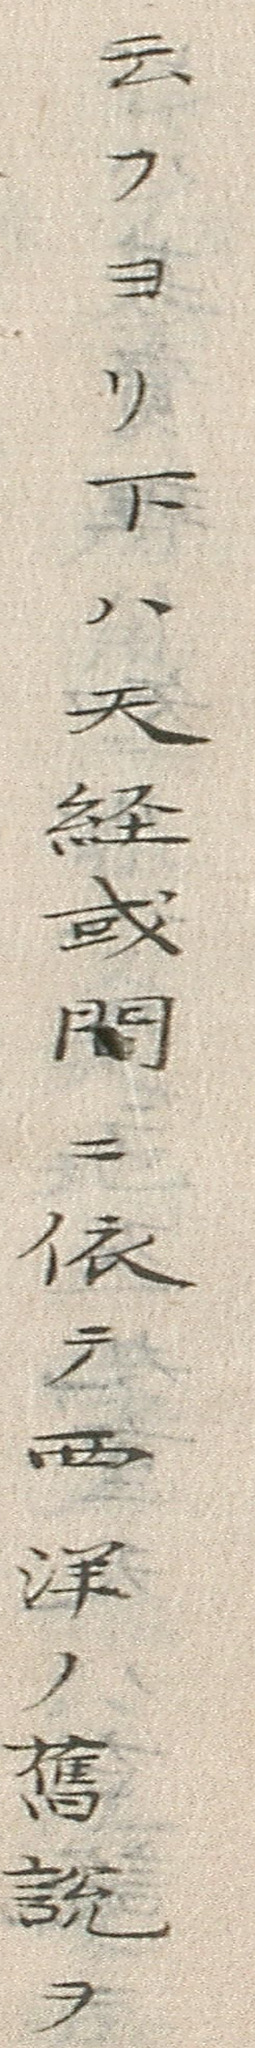云フヨリ下ハ天経或問ニ依テ西洋ノ旧説ヲ
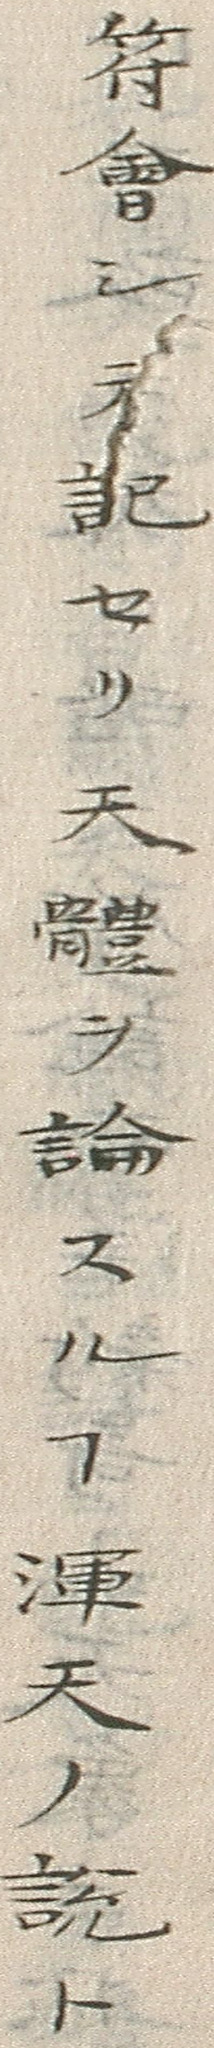符会シテ記セリ天体ヲ論スルコト渾天ノ説ト
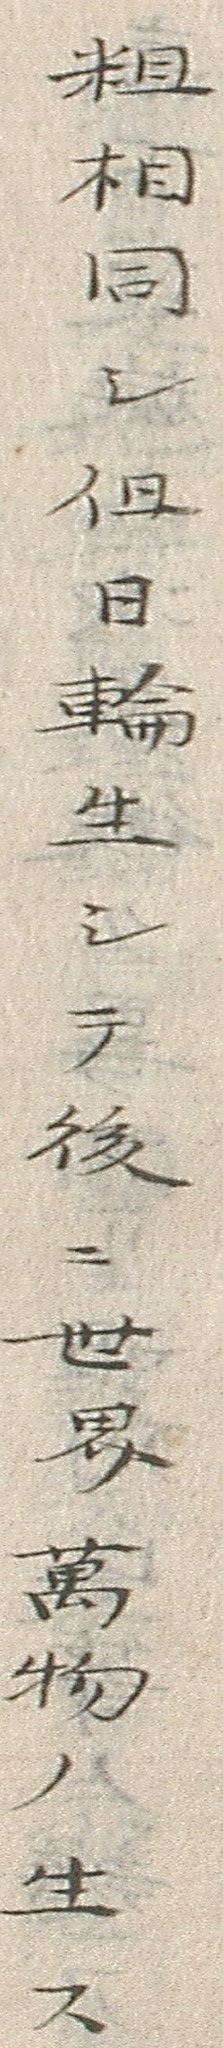粗相同シ但日輪生シテ後ニ世界万物ノ生ス
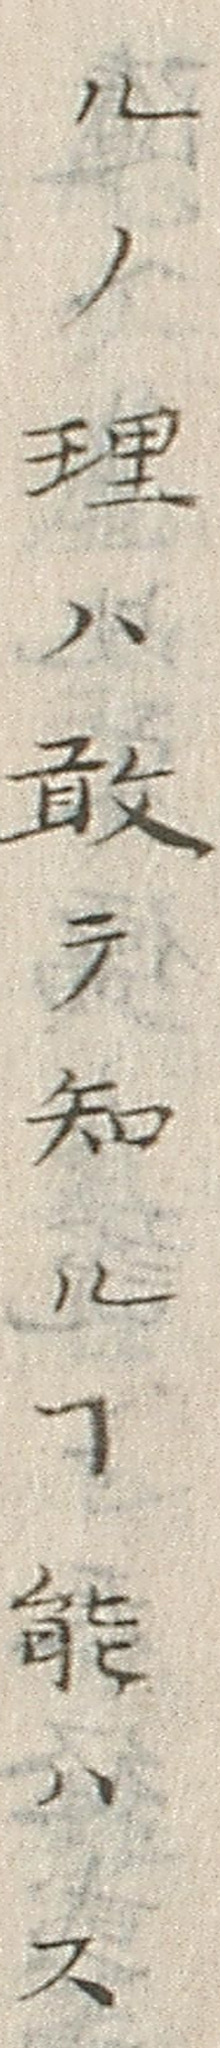ルノ理ハ敢テ知ルコト能ハス
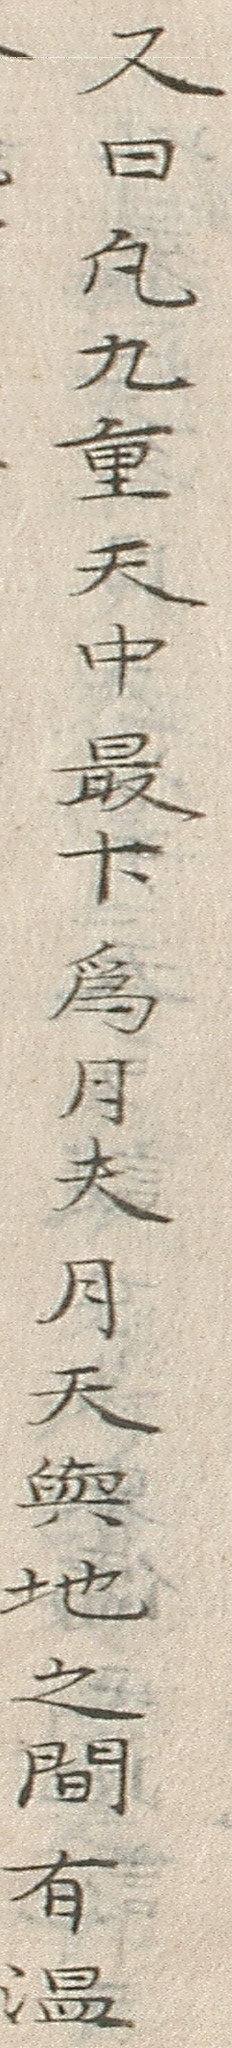又曰凡九重天中最下為月夫月天与地之間有温
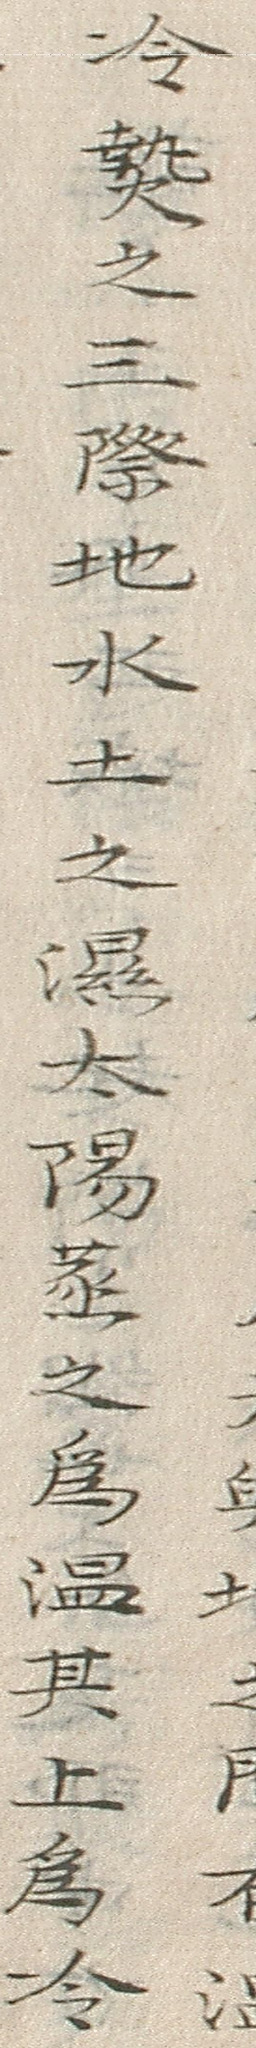冷熱之三際地水土之湿太陽蒸之為温其上為冷
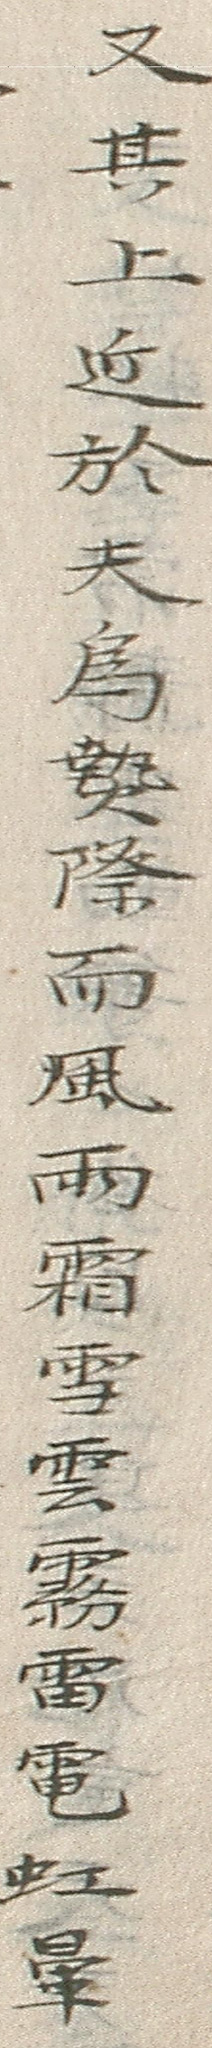又其上近於夫為熱際而風雨霜雪雲霧雷電虹暈
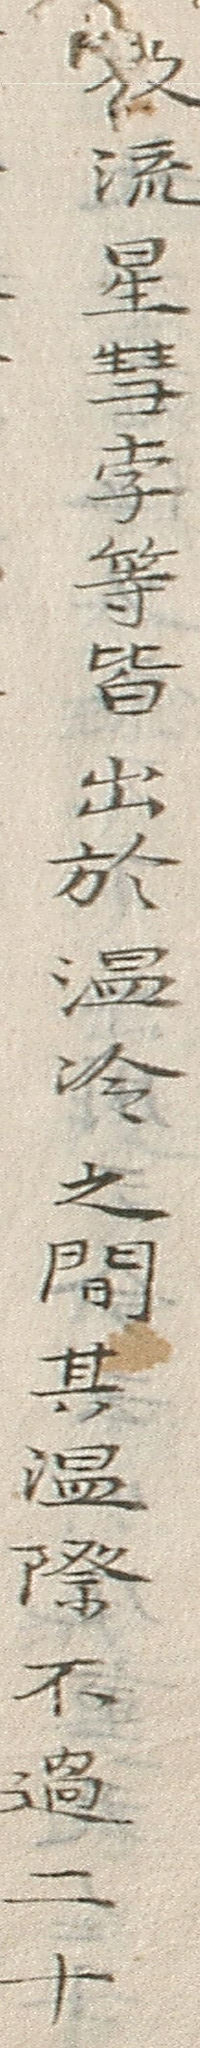及流星彗孛等皆出於温冷之間其温際不過二十
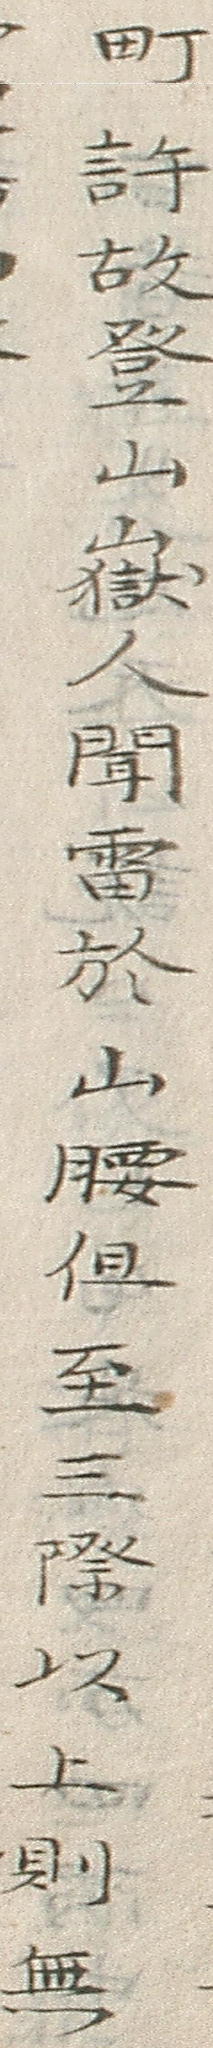町許故登山嶽人聞雷於山腰但至三際以上則無
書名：天學略名目羽翼　全
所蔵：東京大学地震研究所図書室 Earthquake Research Institute Library, The University of Tokyo, JAPAN
